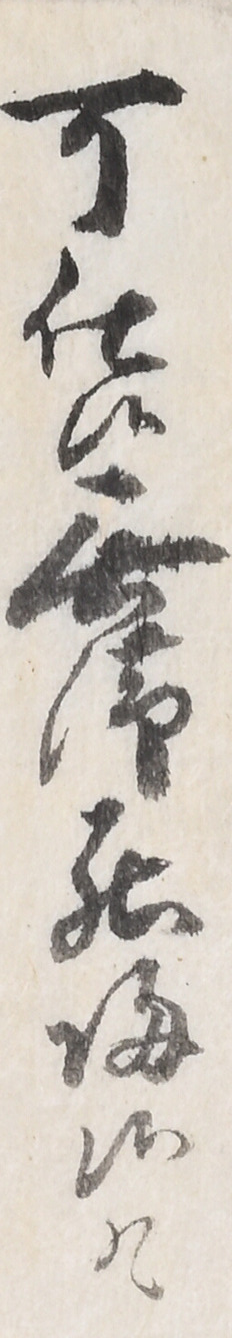可仕候無滞罷帰候ハヽ
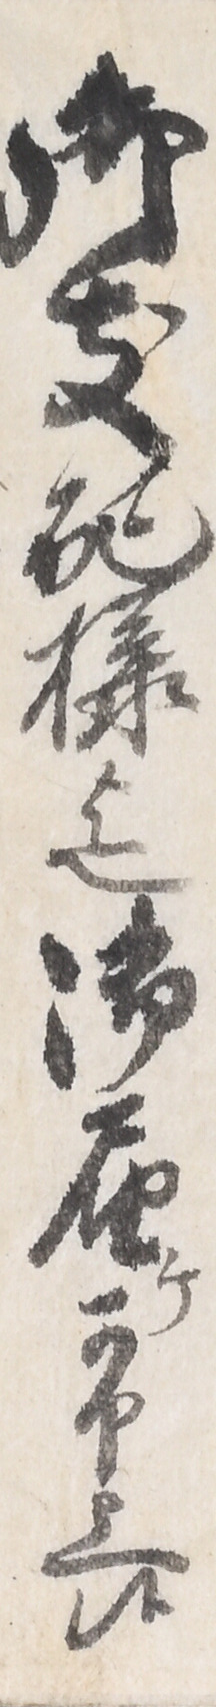御支配様迄御届ケ可申上候
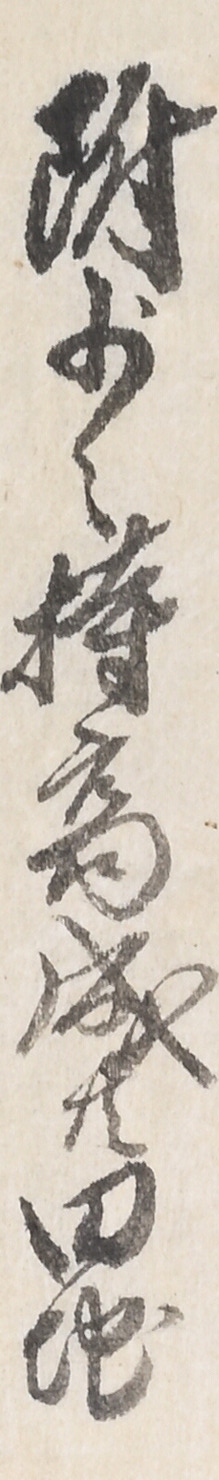附少々持高成共田地
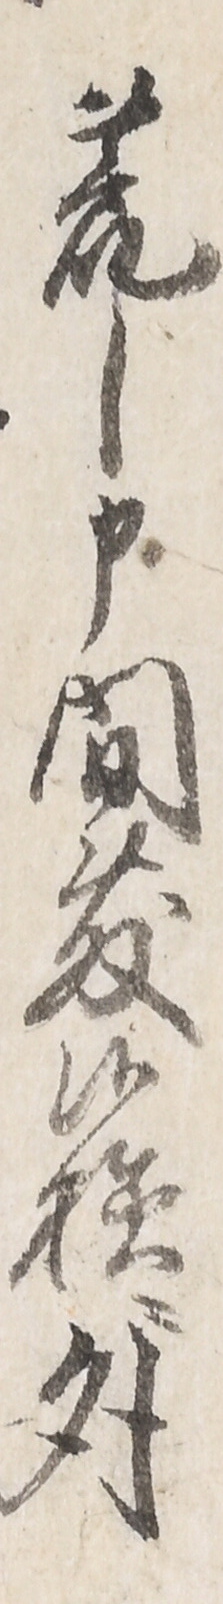荒し申間敷候様ニ外
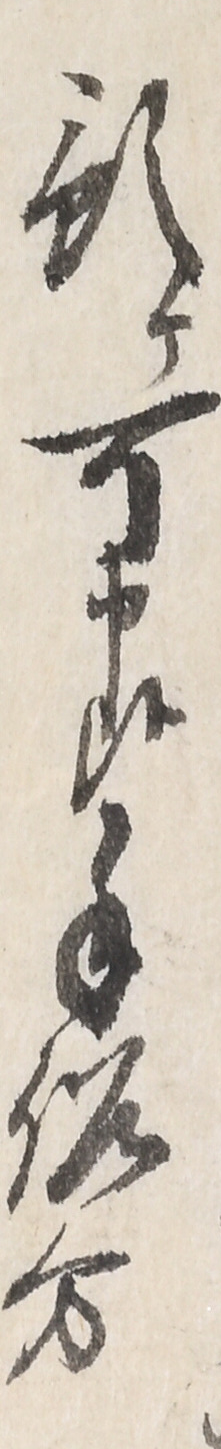預ケ可申候手作分
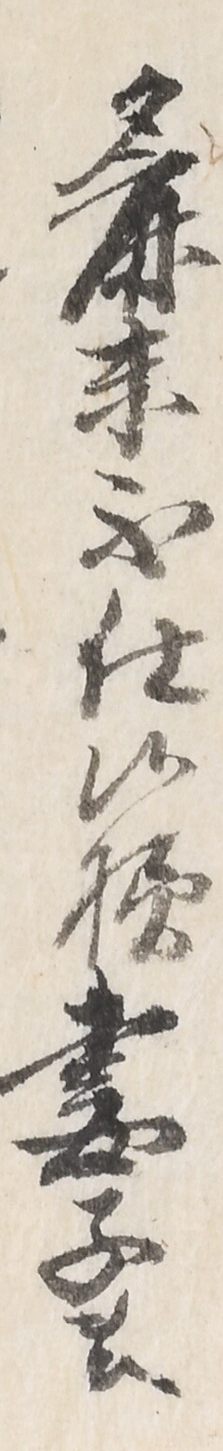麁末不仕候様妻子共
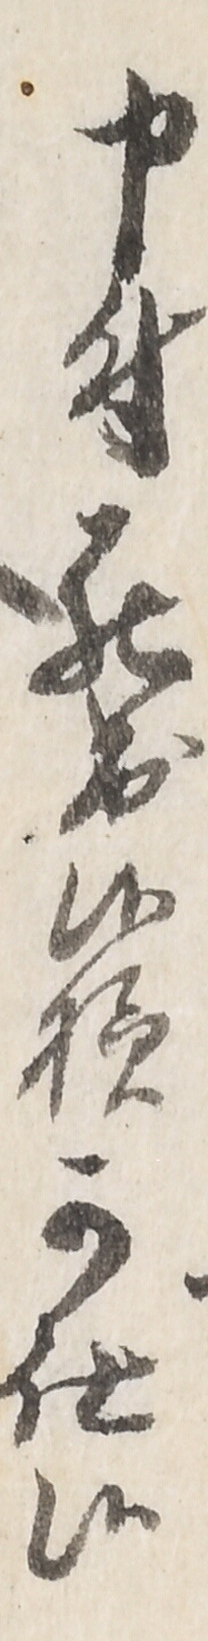申付罷出候様可仕候

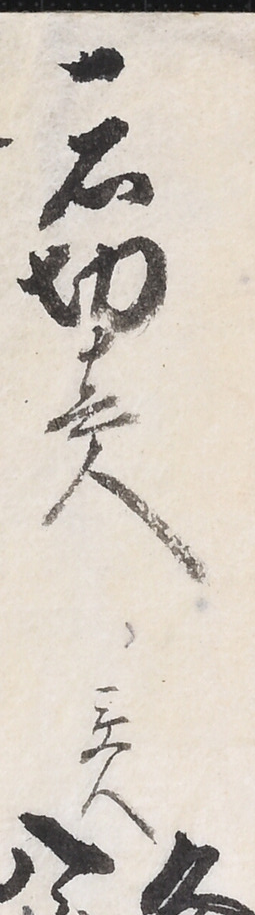一石切壱人粂三郎㊞
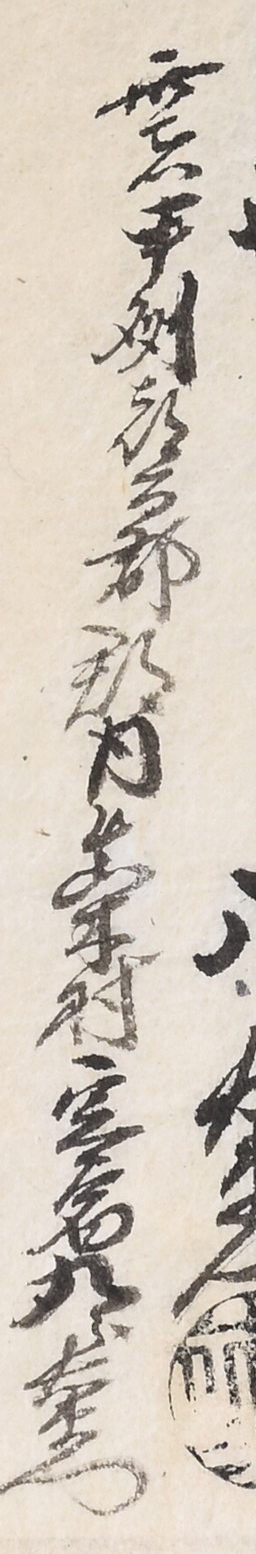此者甲州都留郡郡内真木村定宿九郎右衛門
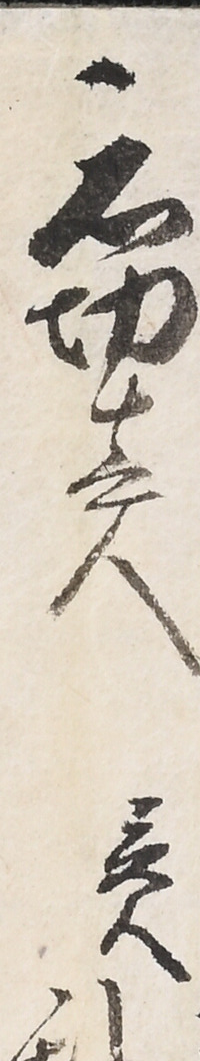一石切壱人芳松
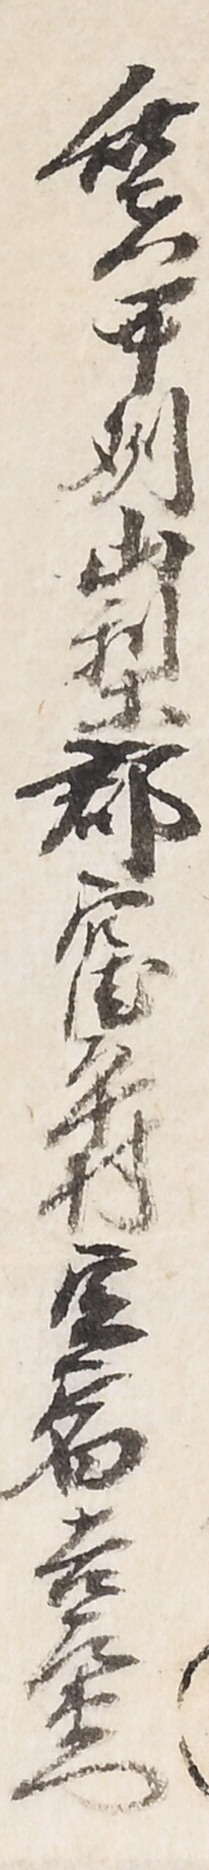此者甲州山梨郡窪平村定宿吉左衛門
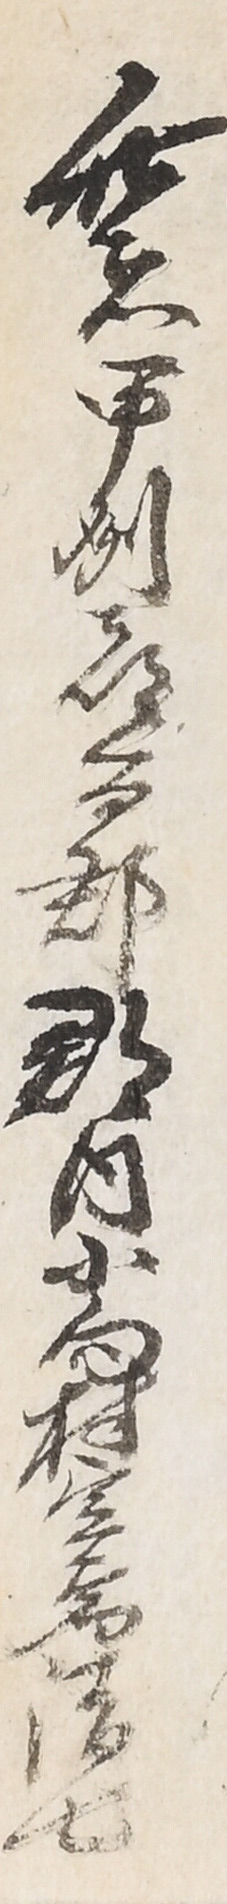此者甲州都留郡郡内小向村定宿清七
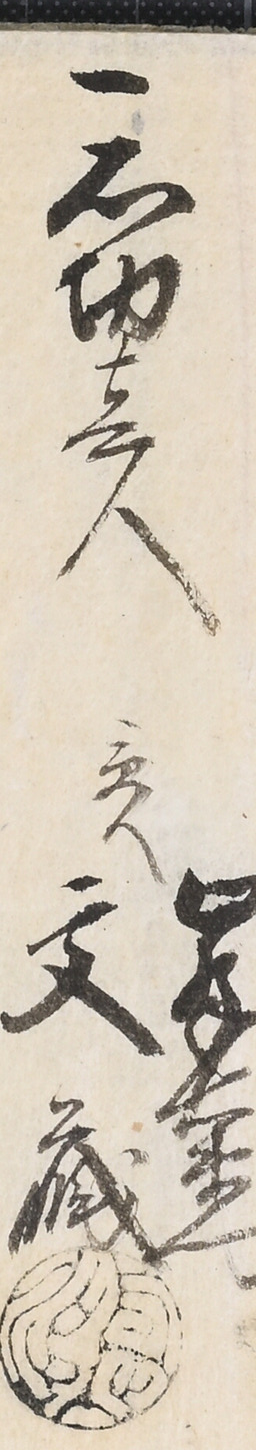一石切壱人芳松
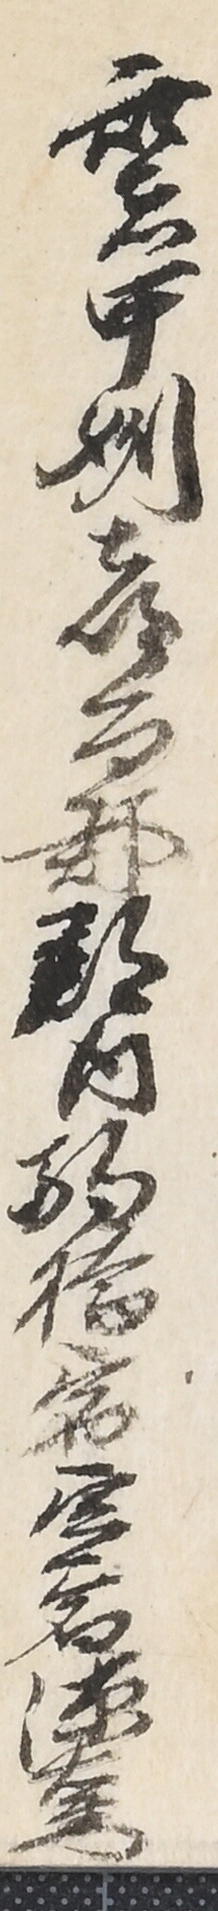此者甲州都留郡郡内駒橋宿定宿源右衛門
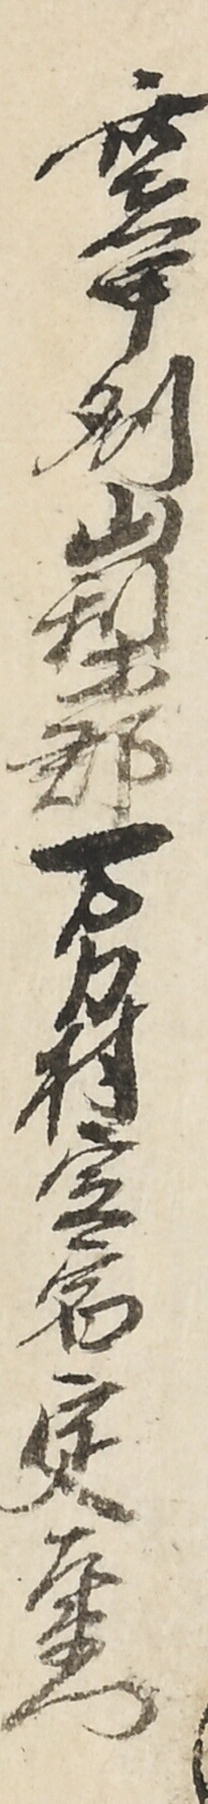此者甲州山梨郡万力村定宿定左衛門
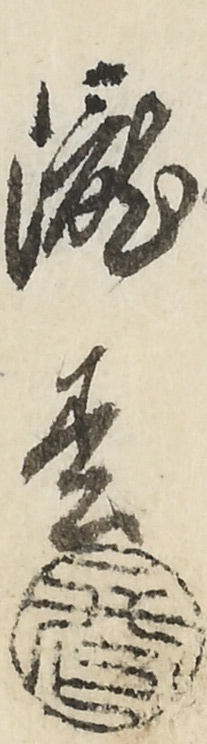瀧松㊞
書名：慶應元乙丑年二月他國出石切名前書上帳
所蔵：伊那市立高遠町図書館・合同会社AMANE
